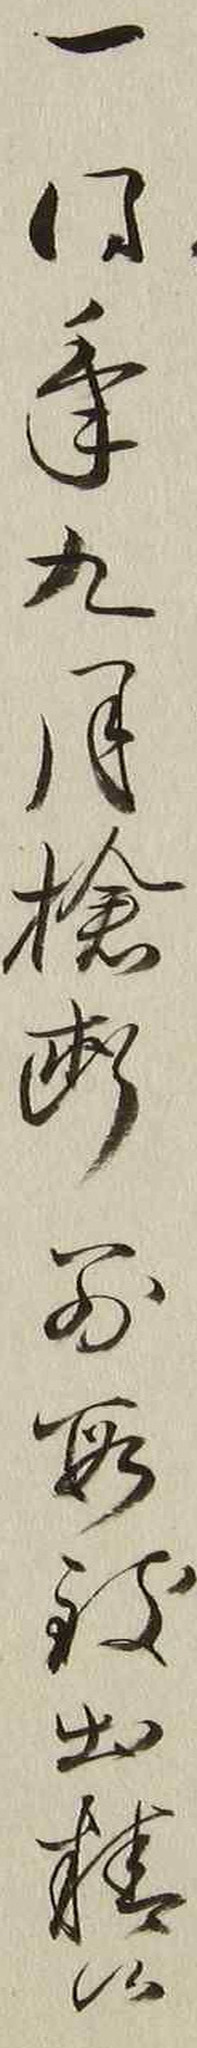一同年九月槍術別段致出精候
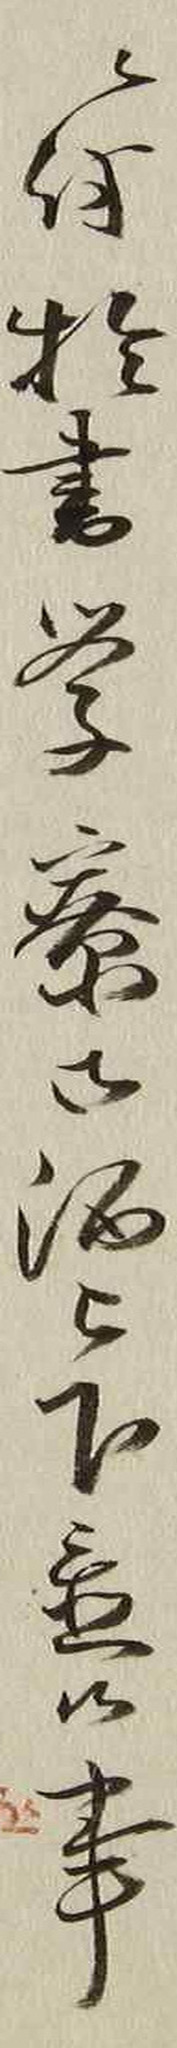ニ付於書学寮御酒被下置候事
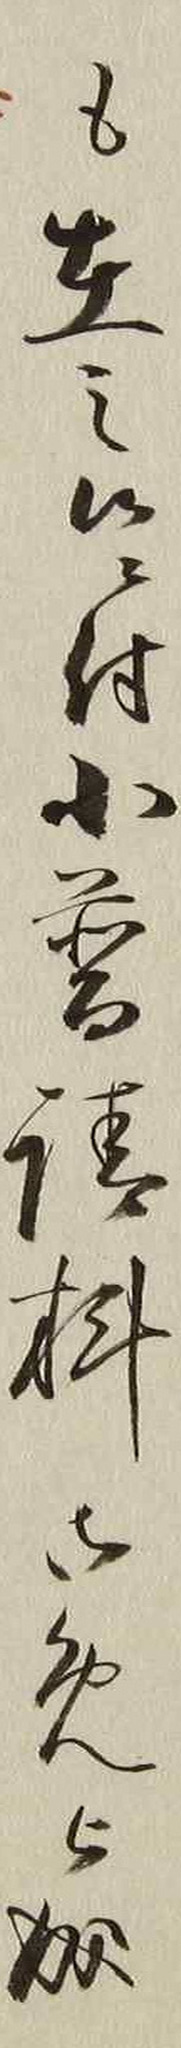も在之候ニ付小普請料御免被成
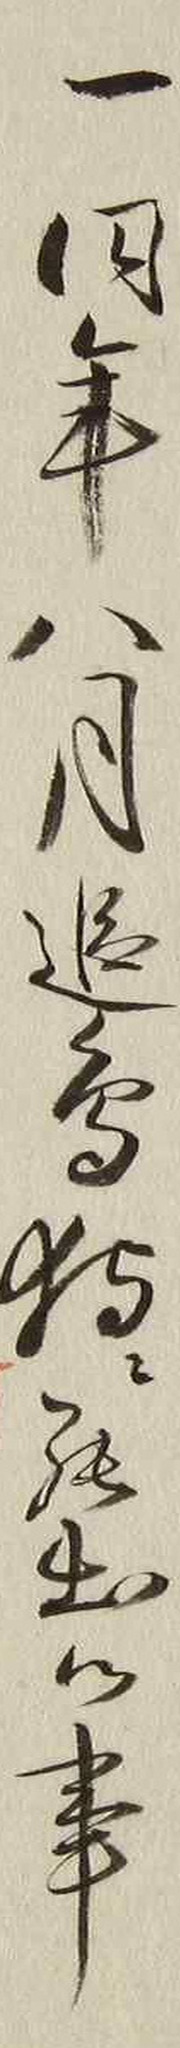一同年八月追鳥狩ニ罷出候事
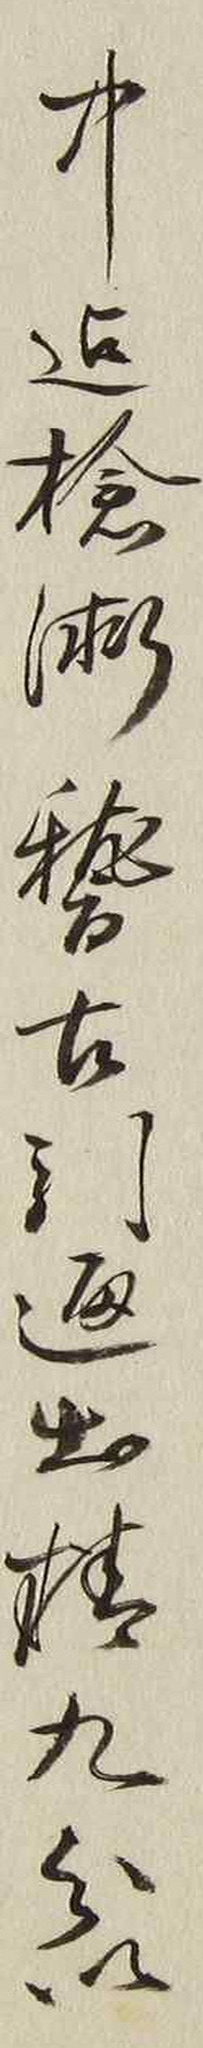中迄槍術稽古引通出精九分以
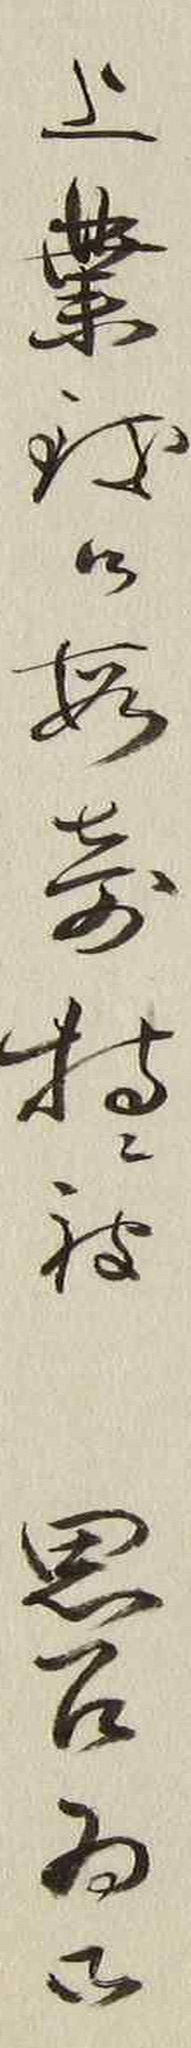上業致候段奇特ニ被思召為御
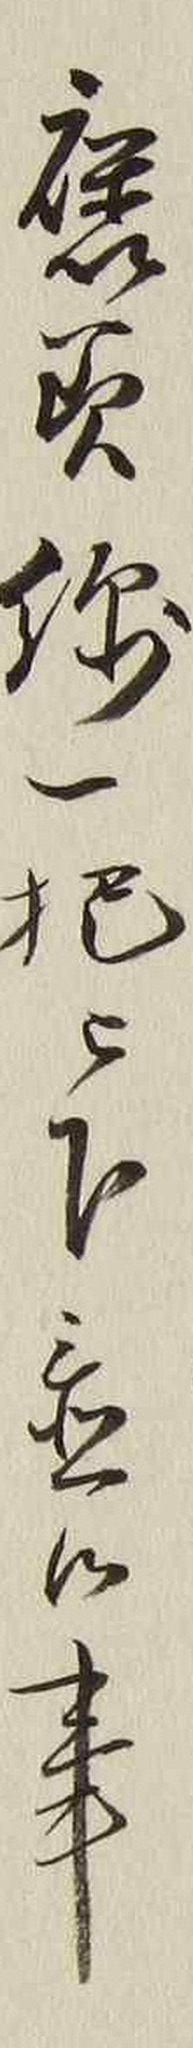褒美綿一把被下置候事
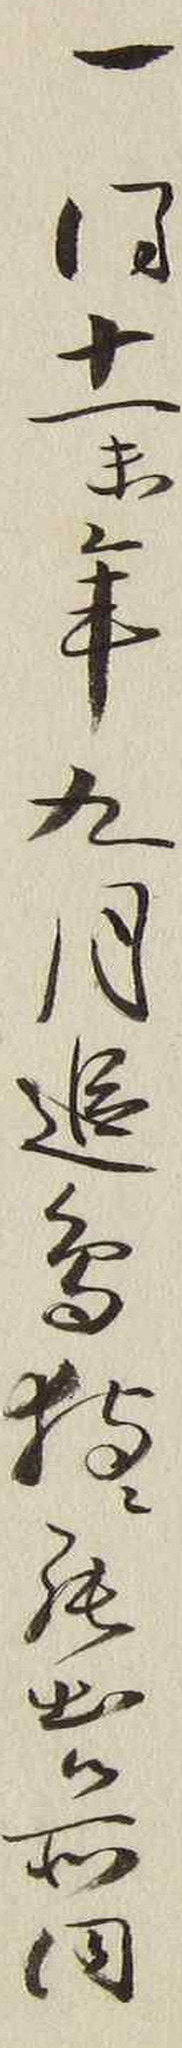一同十一未年九月追鳥狩ニ罷出候所同
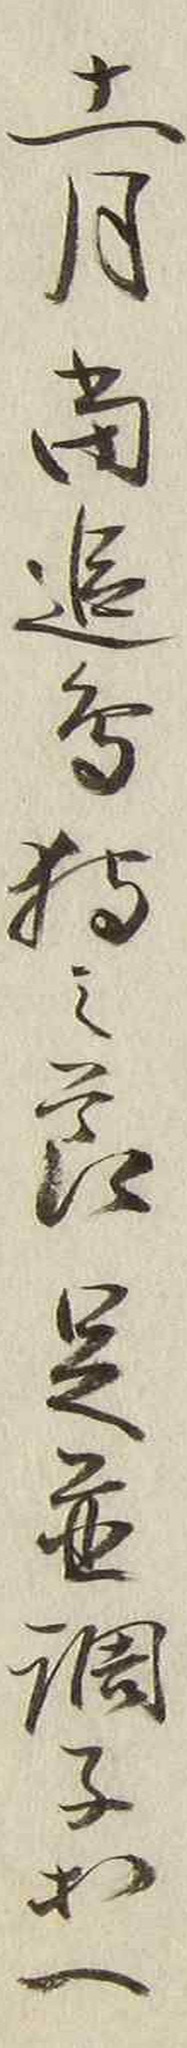十一月当追鳥狩之節足並調子等一

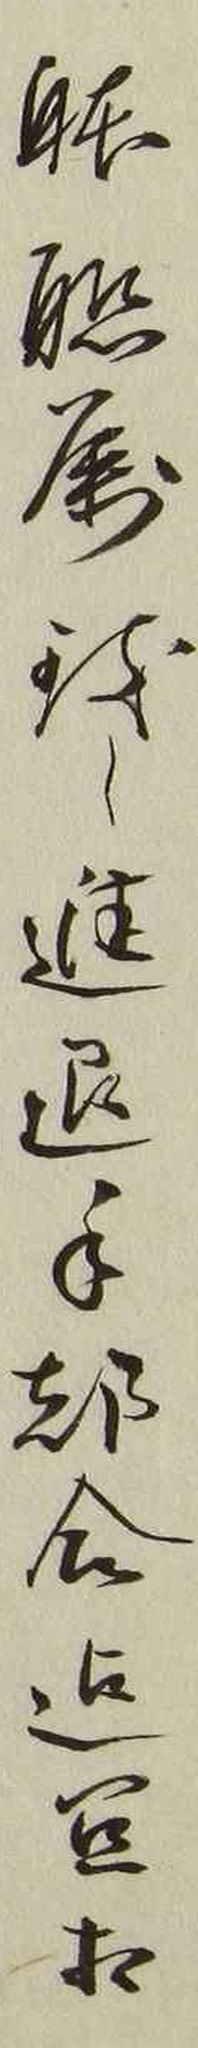体聨属致し進退手都合迄宜相
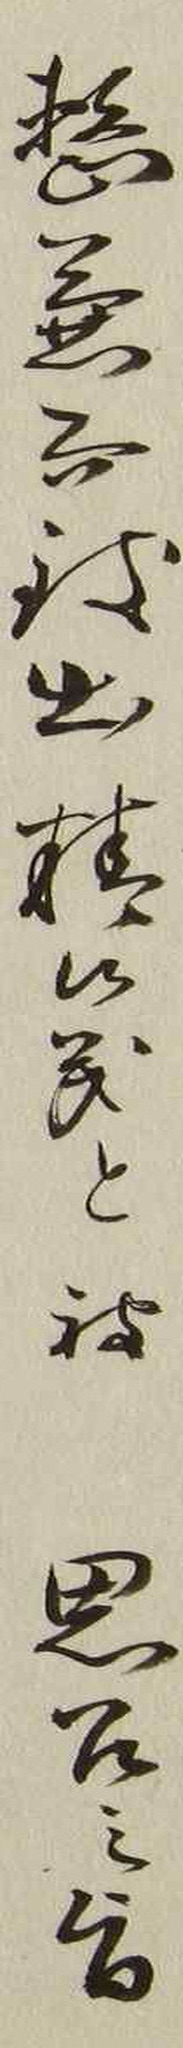整兼而致精出候義と被思召之旨
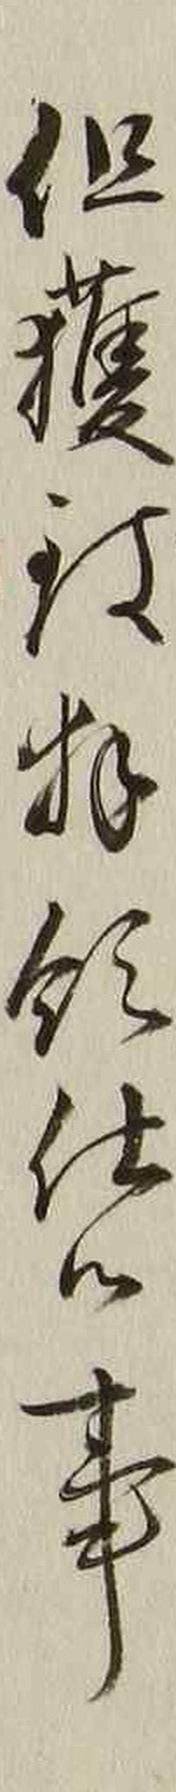但獲致拝領仕候事
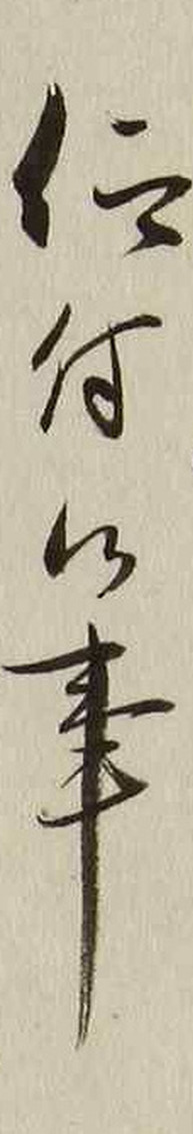仰付候事
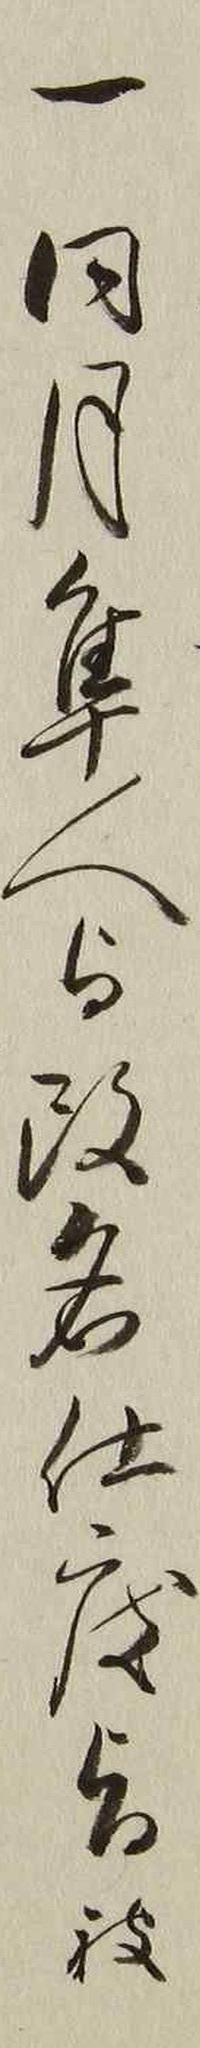一同月隼人と改名仕度旨被
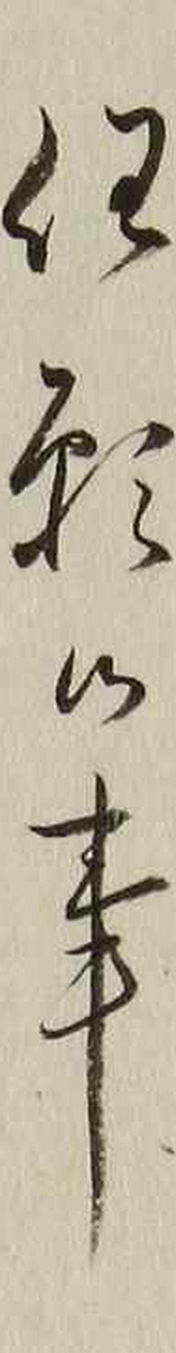任願候事
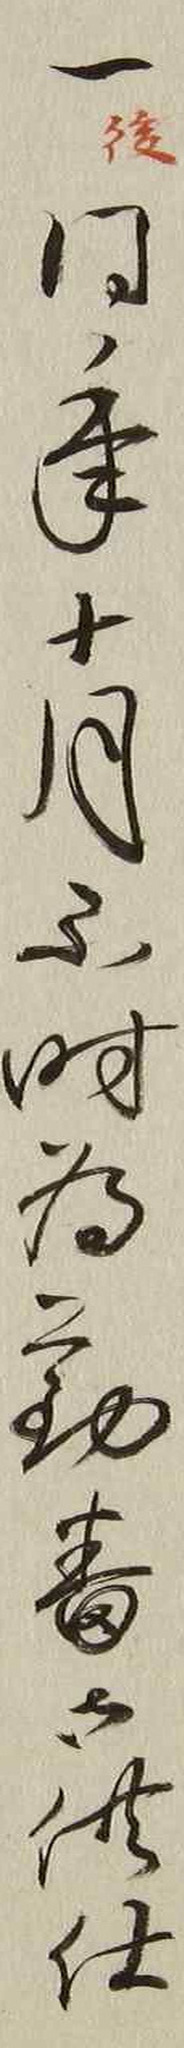一後同年十月不時為勤番御供仕
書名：諸士系譜　巻之163　な之部5
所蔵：会津若松市立会津図書館
